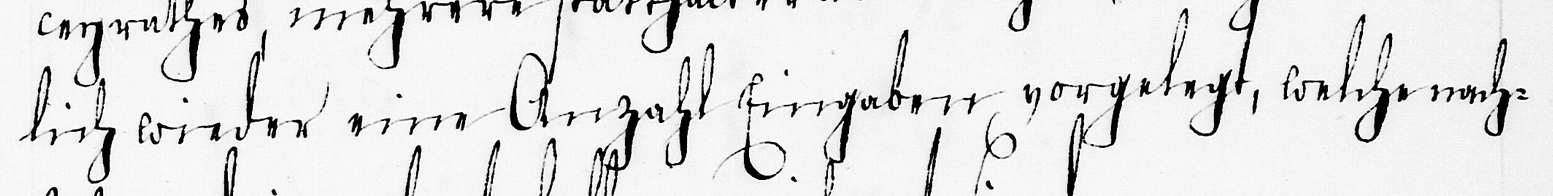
lich wieder eine Anzahl Eingaben vorgelegt, welche nach¬
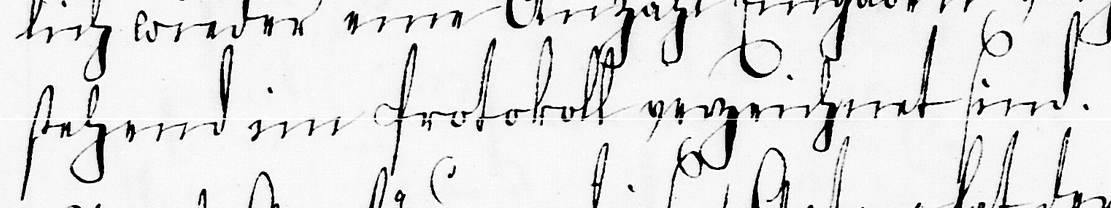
stehend im Protokoll verzeichnet sind.
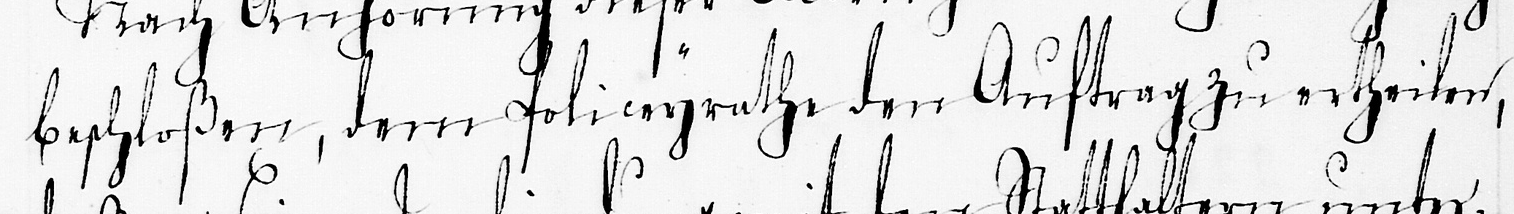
beschloßen, dem Policeyrathe den Auftrag zu ertheilen,
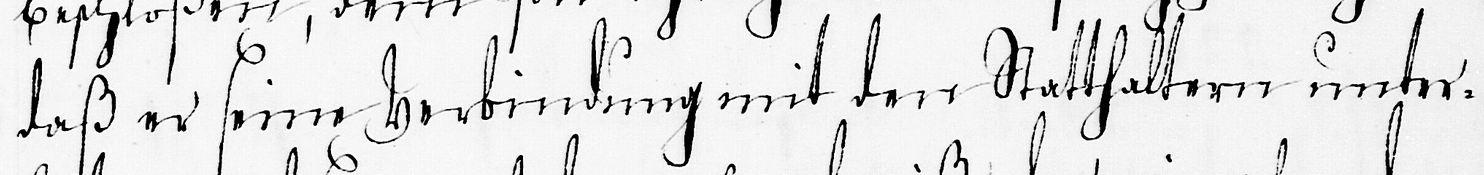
daß er seine Verbindung mit den Statthaltern unter¬
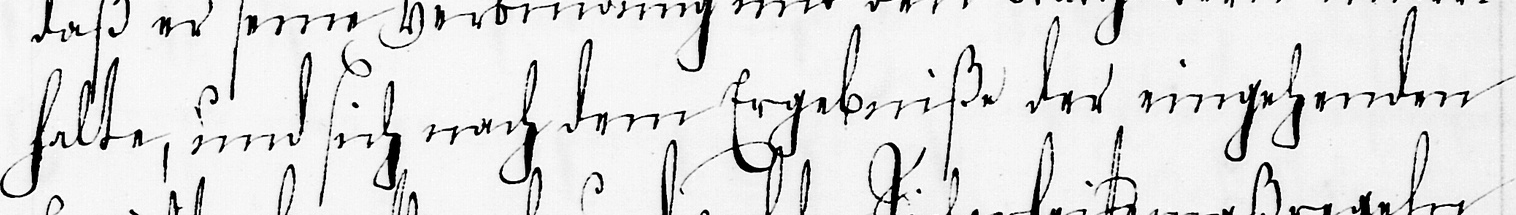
halte, und sich nach dem Ergebniße der eingehenden
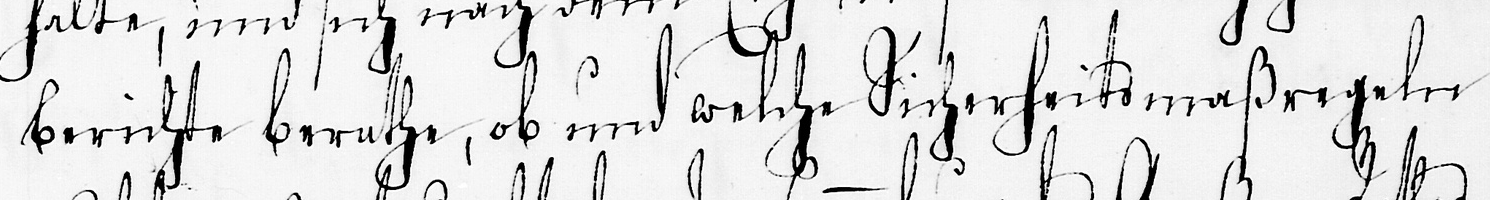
Berichte berathe, ob und welche Sicherheitsmaßregeln
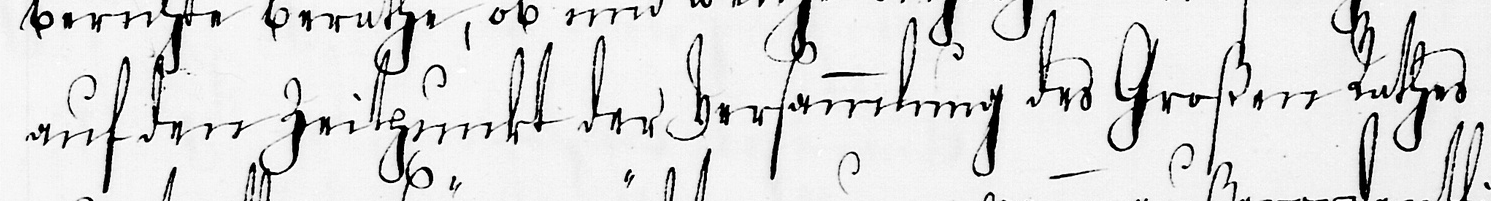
auf den Zeitpunkt der Versammlung des Großen Rathes
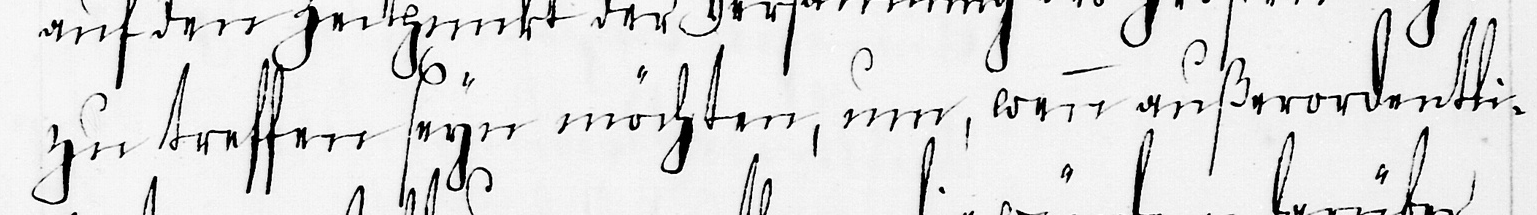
zu treffen seyn möchten, um, wenn außerordentli¬
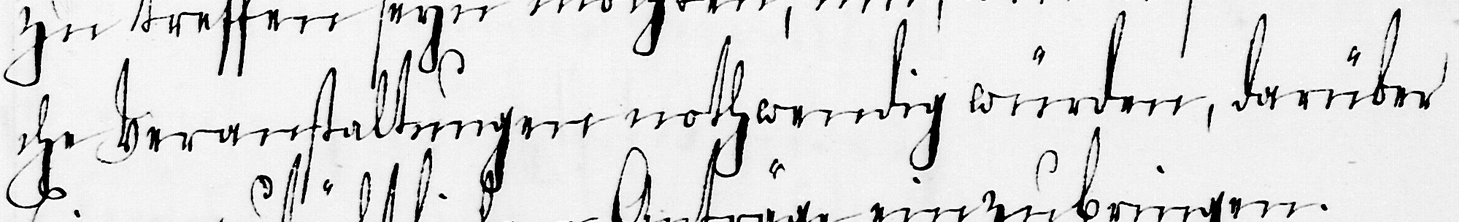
che Veranstaltungen nothwendig würden, darüber
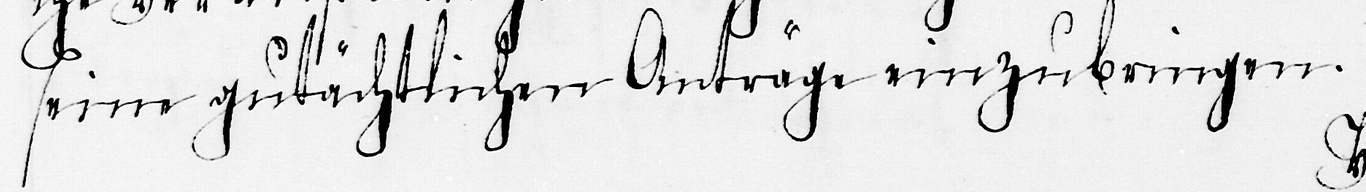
seine gutächtlichen Anträge einzubringen.
